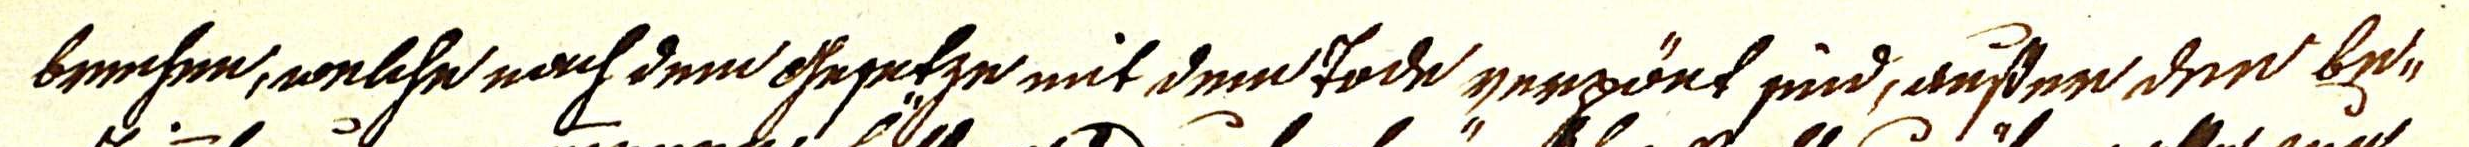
brechen, welche nach dem Gesetze mit dem Tode verpönt sind, außer den be¬
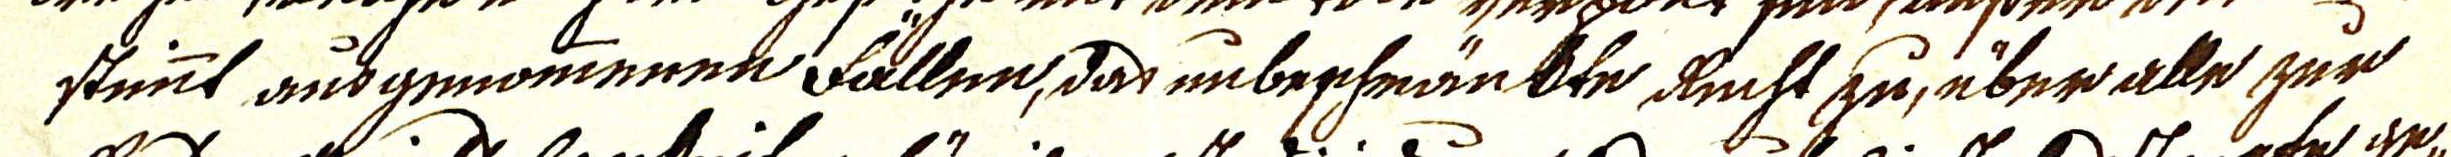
stimmt ausgenommenen Fällen, das unbeschränkte Recht zu, über alle zur
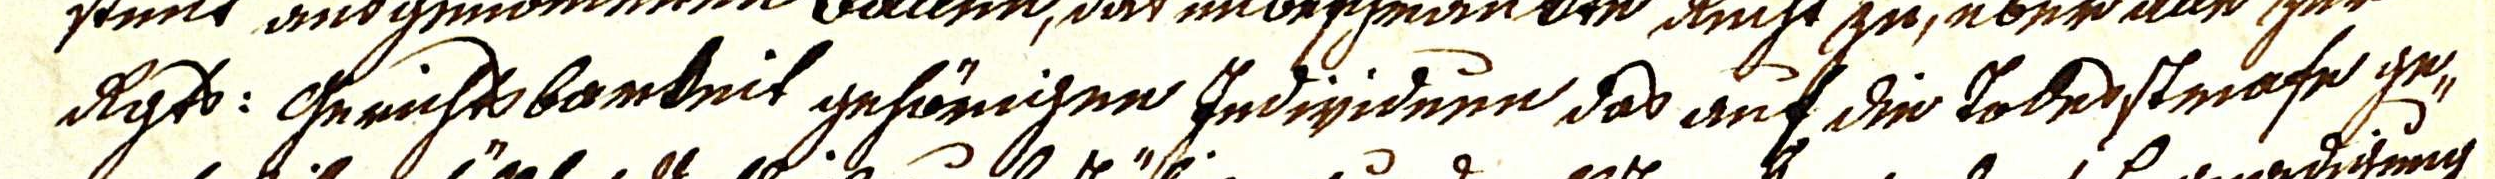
Rgts. Gerichtsbarkeit gehörigen Jedivideun das auf die Todesstrafe ge¬
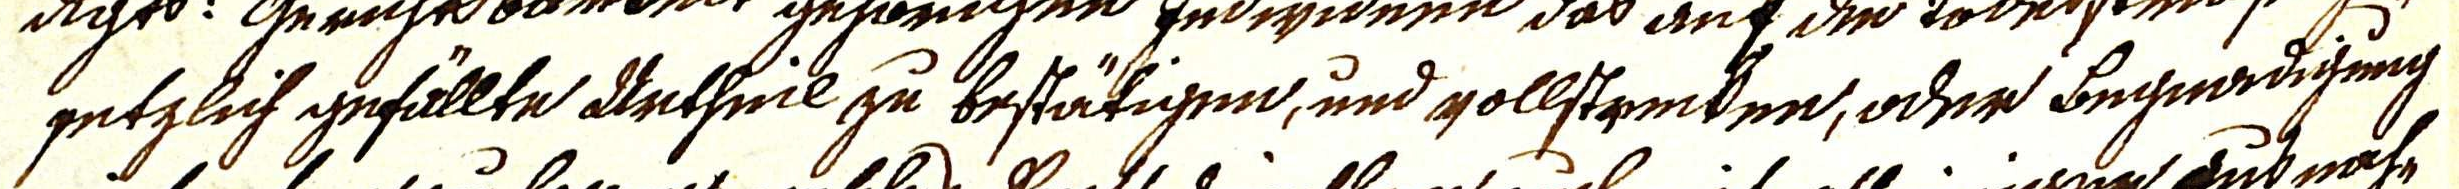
setzlich gefällte Urtheil zu bestätigen, und vollstrecken, oder Begnadigung
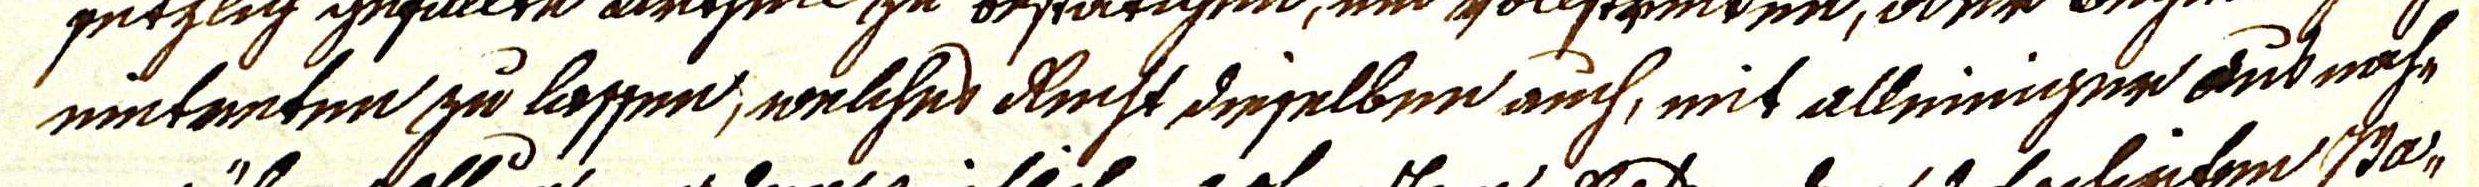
eintreten zu lassen, welches Recht dieselben auch, mit alleiniger aus nah¬
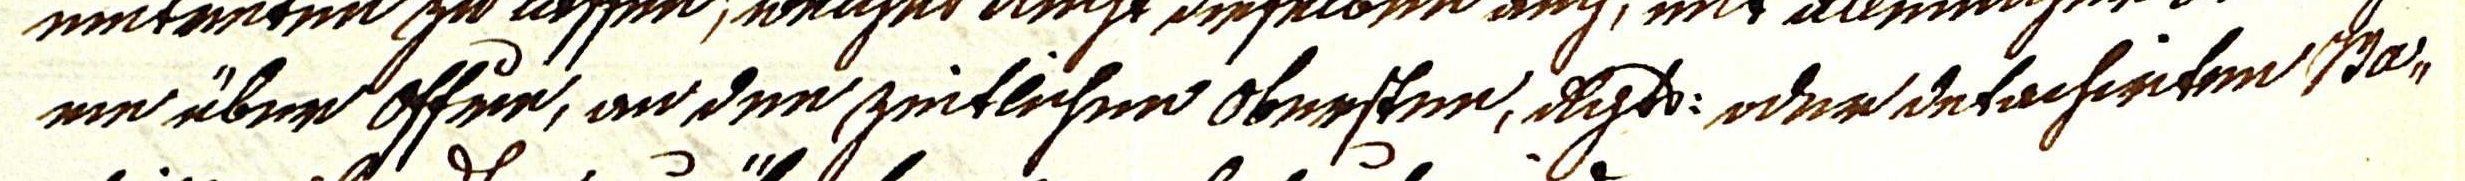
me über Offre, an den zeitlichen Obersten, Rgts. oder Detachirten Ba¬
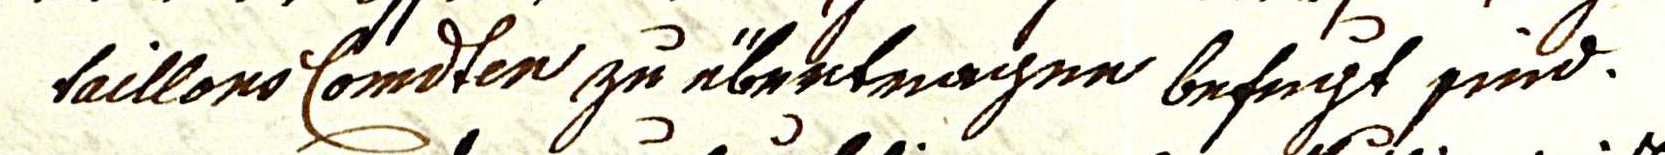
taillons Comdten zu übertragen befugt sind.
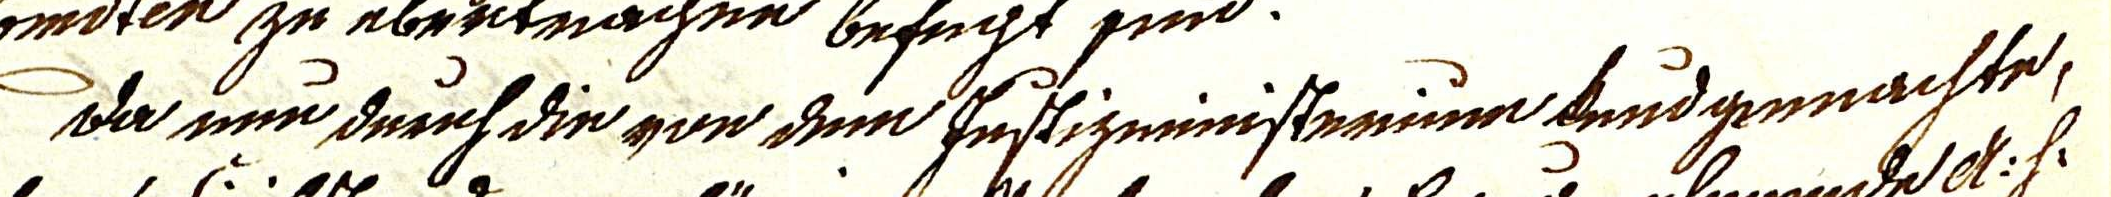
Da nun durch die von dem Justizministerium kundgemachte,
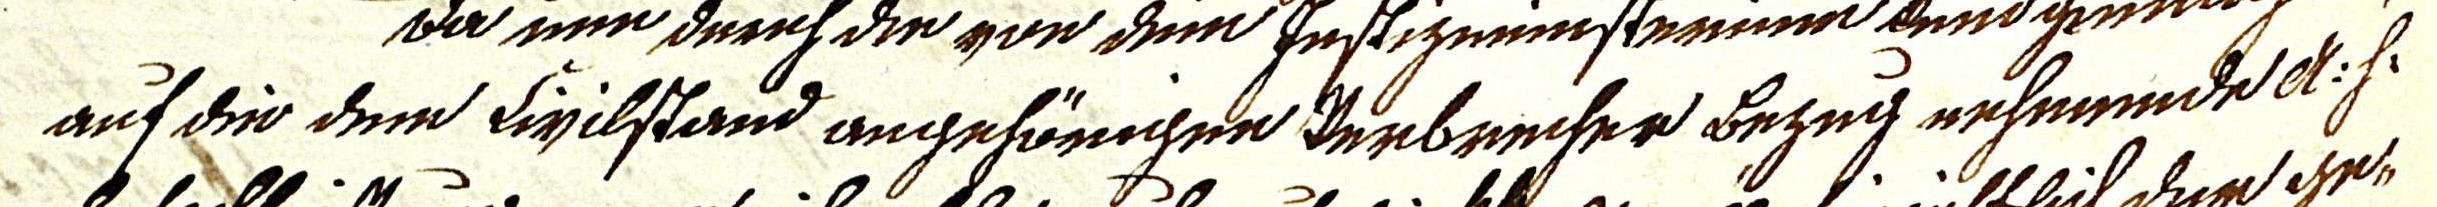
auf die dem Civilstand angehörigen Verbrecher Bezug nehmende A: h:
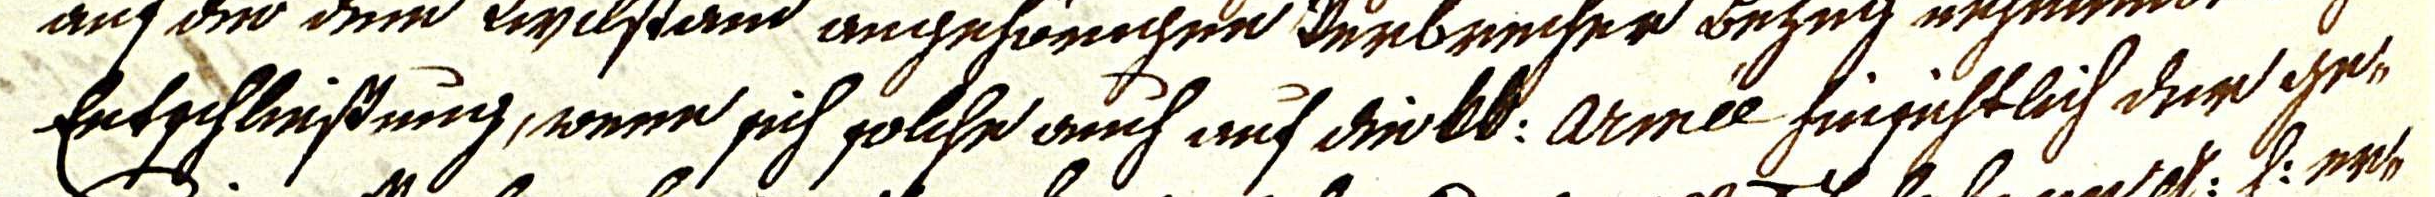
Entschließung, wenn sich solche auch auf die kk: Armée hinsichtlich der ge¬
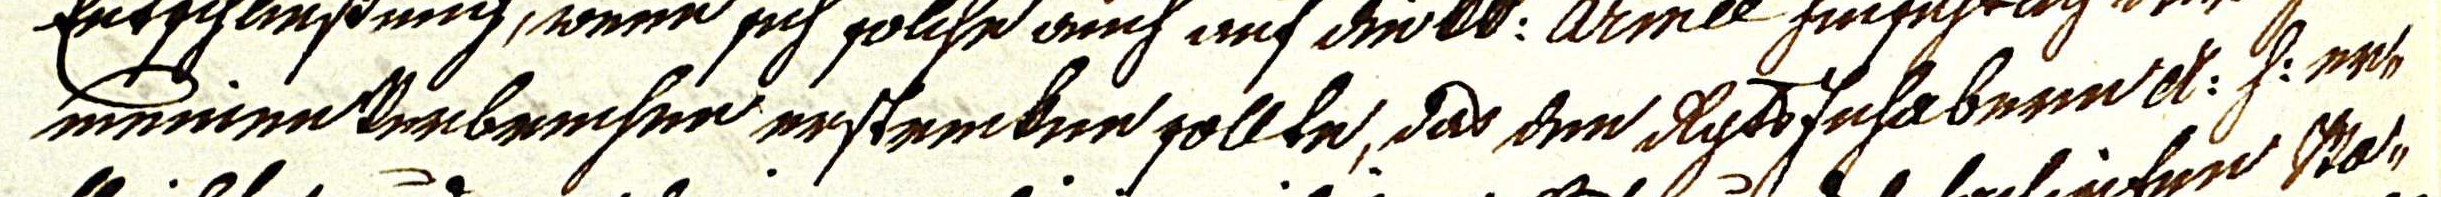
meinen Verbrechen erstrecken sollte, das den Rgts Jnhabern A: h: er¬
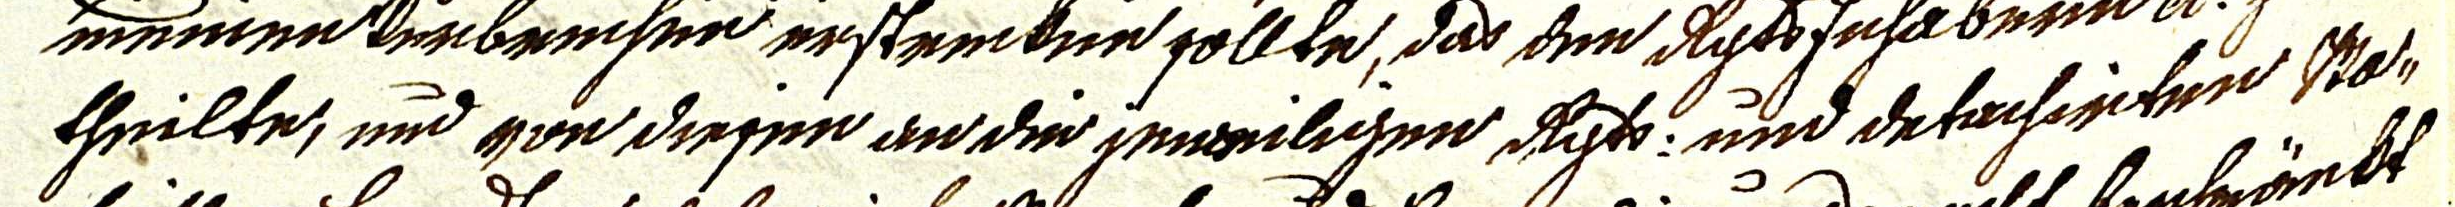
theilte, und von diesen an die jeweiligen Rgts: und Detachirten Ba¬
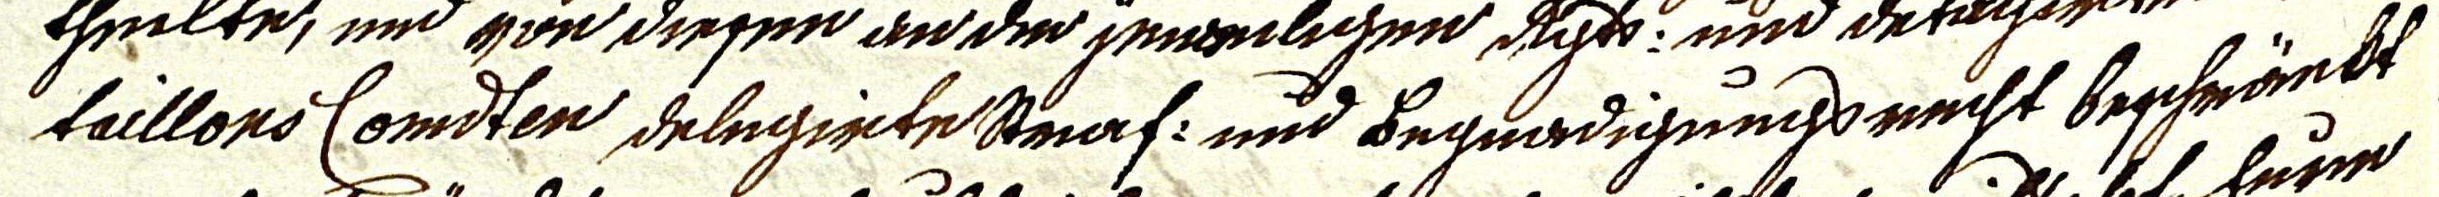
taillons Comdten Delegirte Straf: und Begnadigungsrecht beschränkt
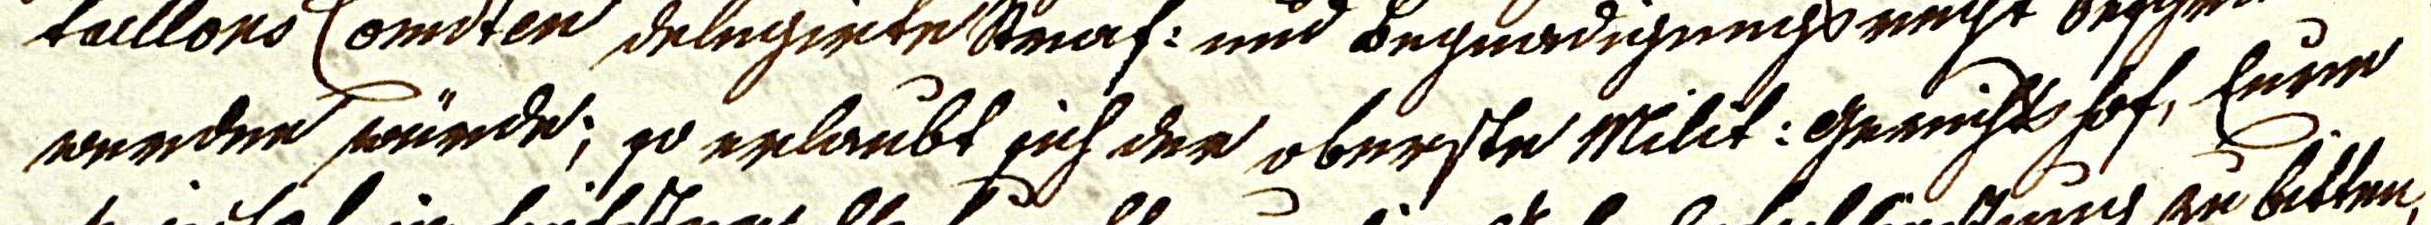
werden würde; so erlaubt sich der oberste Milit: Gerichtshof, Eure
